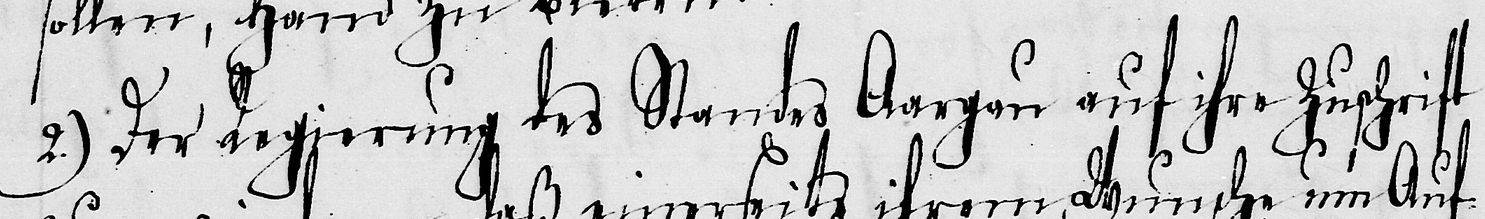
2.) Der Regierung des Standes Aargau auf ihre Zuschrift
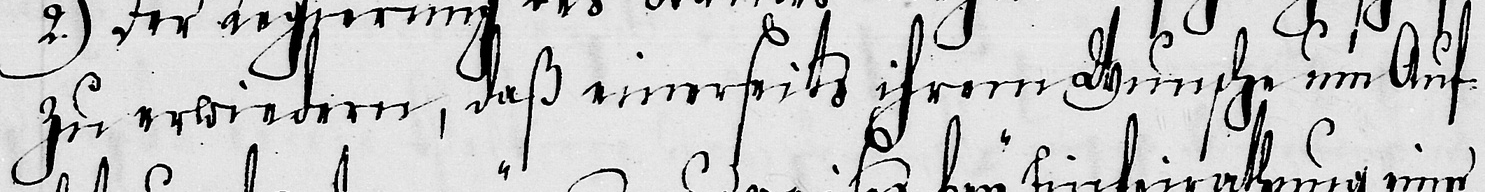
zu erwiedern, daß einerseits ihrem Wunsche um Auf¬
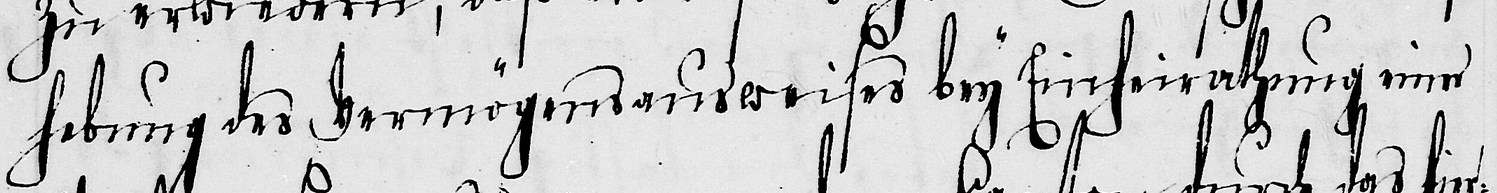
hebung des Vermögensausweises bey Einheirathung einer
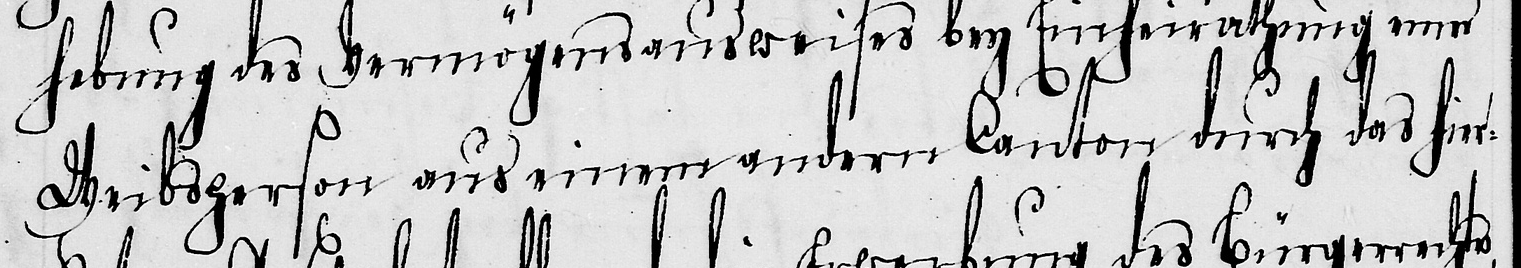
Weibsperson aus einem andern Canton durch das hier¬
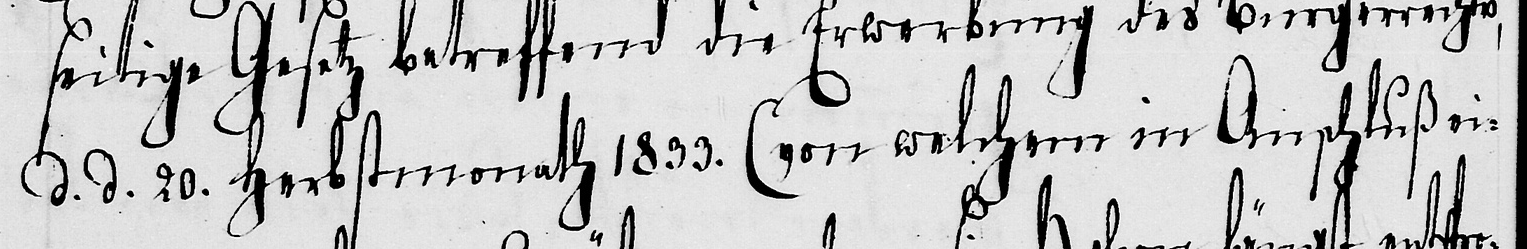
d. d. 20. Herbstmonath 1833. (von welchem in Anschluß ei¬
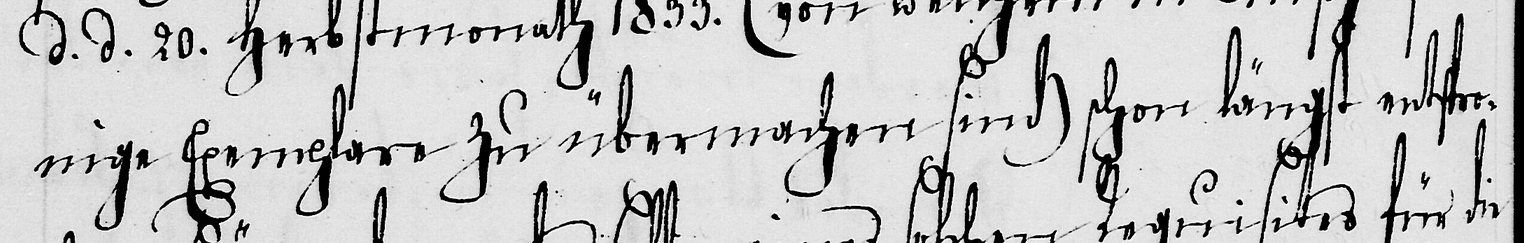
nige Exemplare zu übermachen sind) schon längst entspr¬
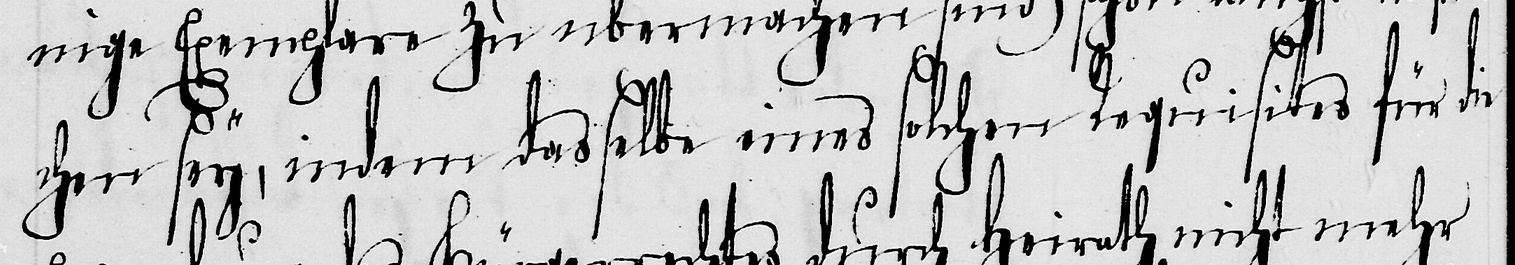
chen sey, indem dasselbe eines solchen Requisites für d¬
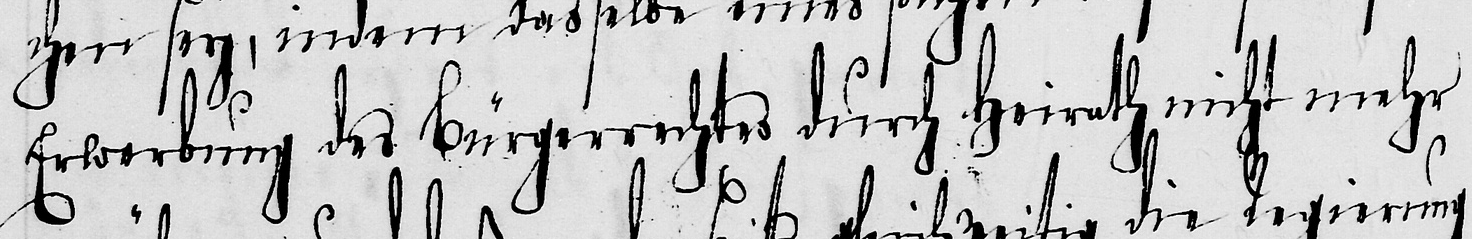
Erwerbung des Bürgerrechtes durch Heirath nicht mehr
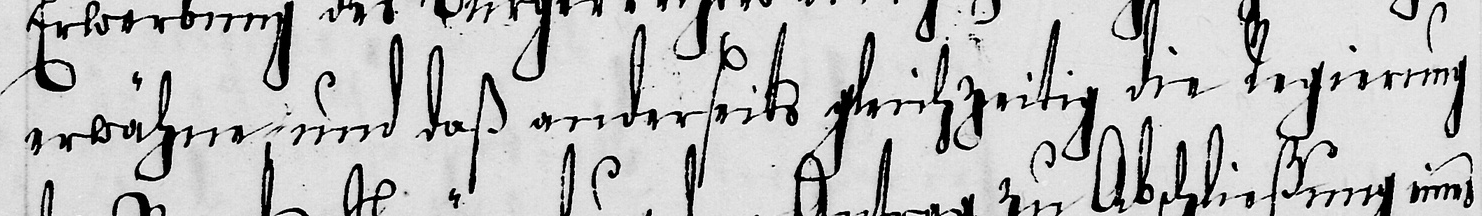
erwähne und daß anderseits gleichzeitig die Regierung
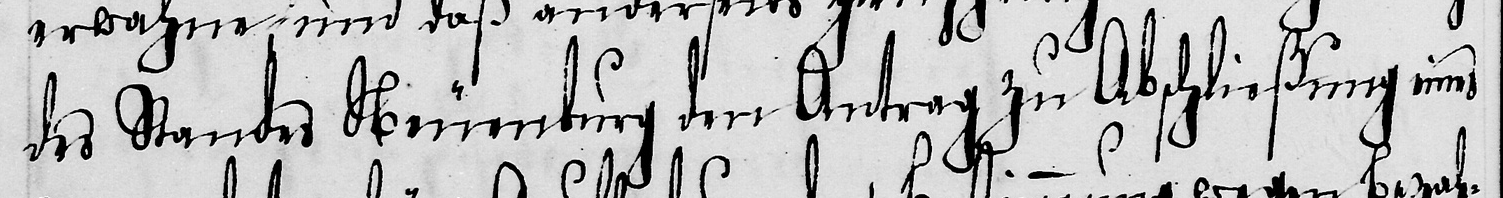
des Standes Neuenburg den Antrag zu Abschließung ei¬
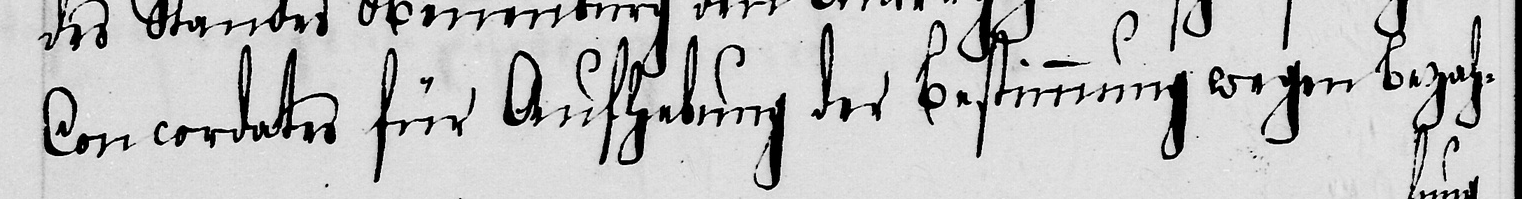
Concordates für Aufhebung der Bestimmung wegen Bezah-
